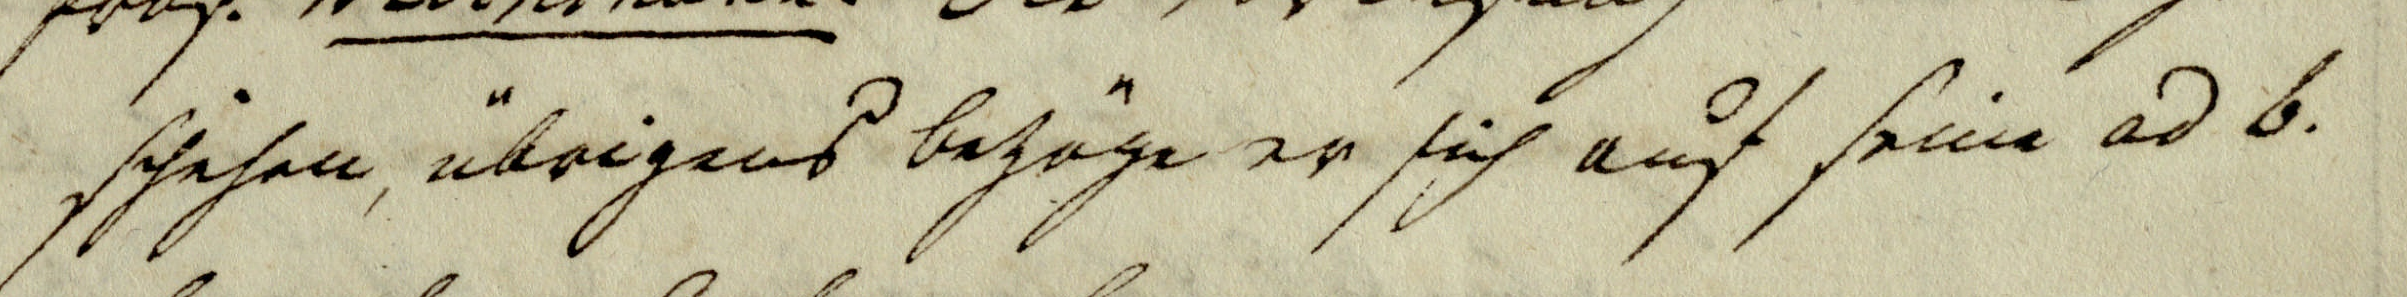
schehen übrigens bezöge er sich auf seine ad b.
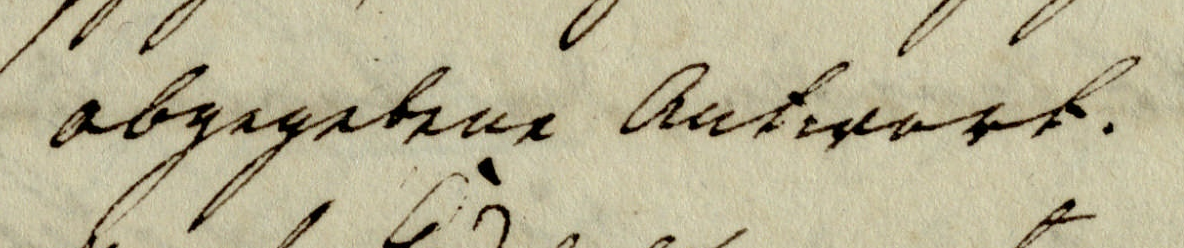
abgegebene Antwort.
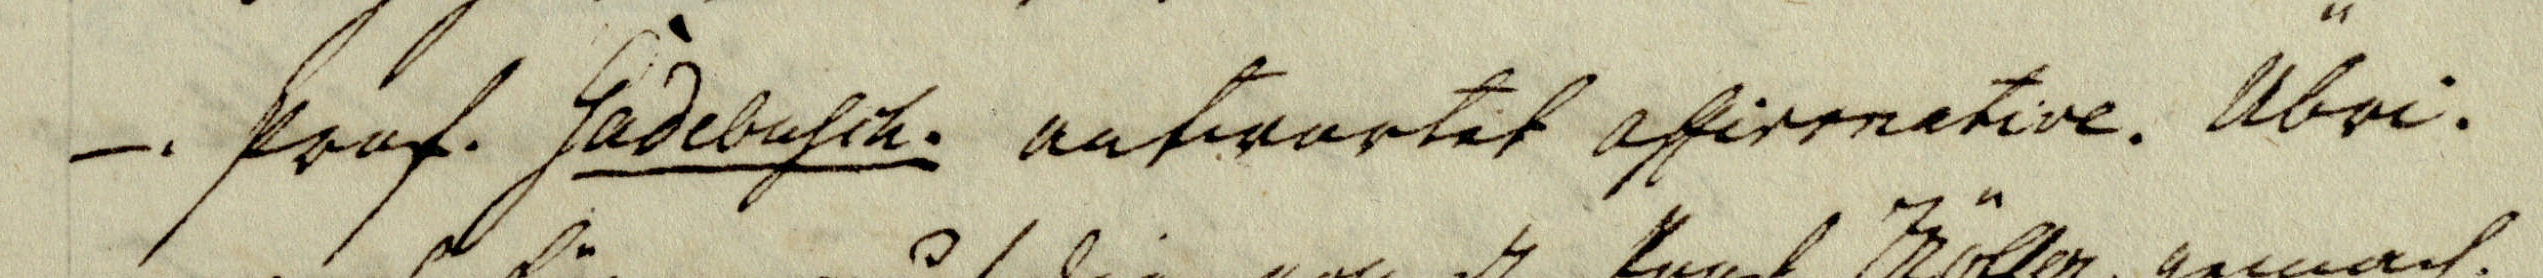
Prof. Gadebusch. antwortet affirmative. Übri¬
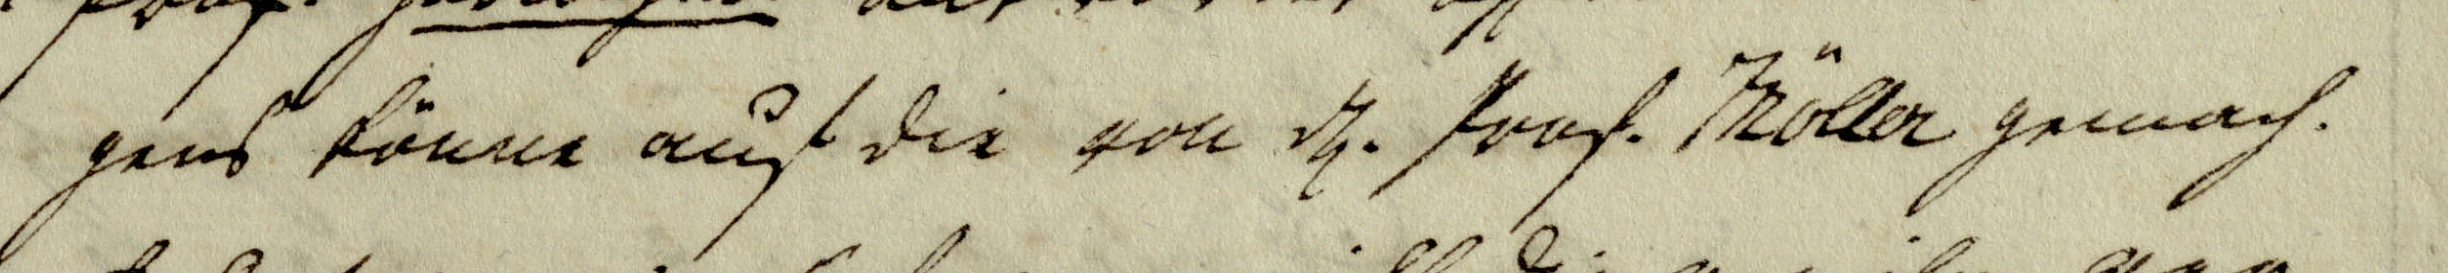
gens könne auf die von dh. Prof. Möller gemach¬
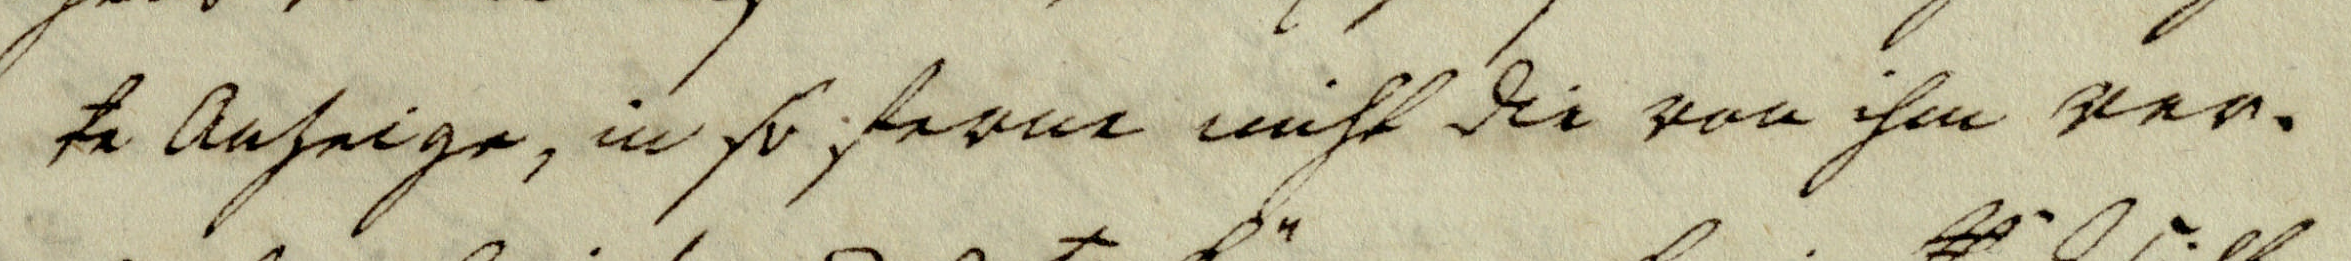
te Anzeige, in so ferne nicht die von ihm ver¬
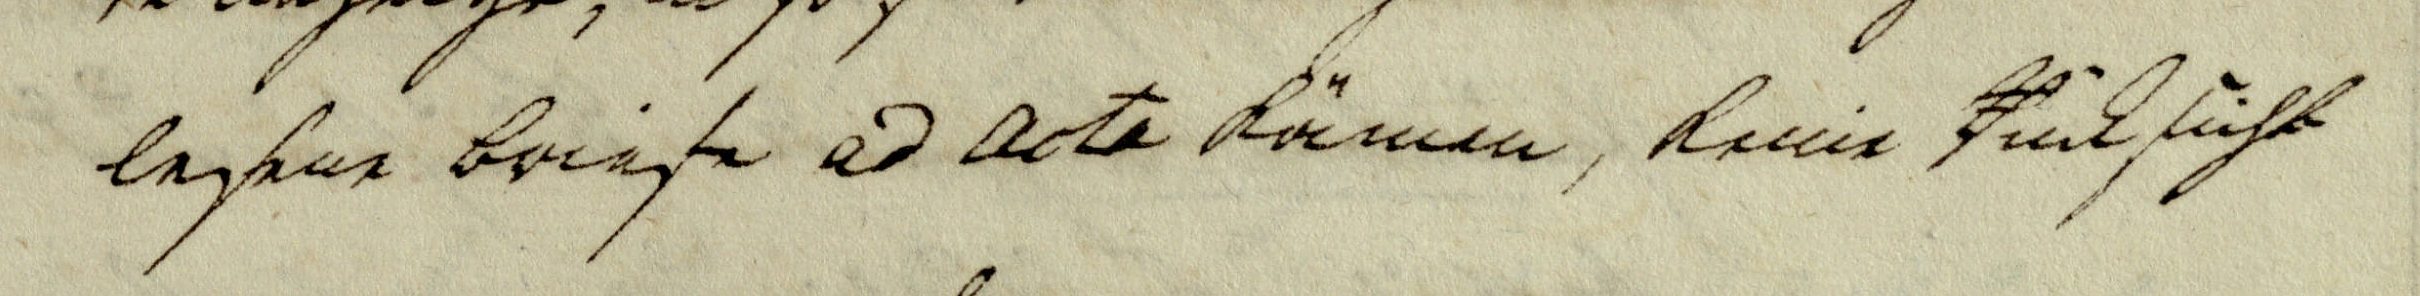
lesene Briefe ad Acta kämen, keine Rücksicht
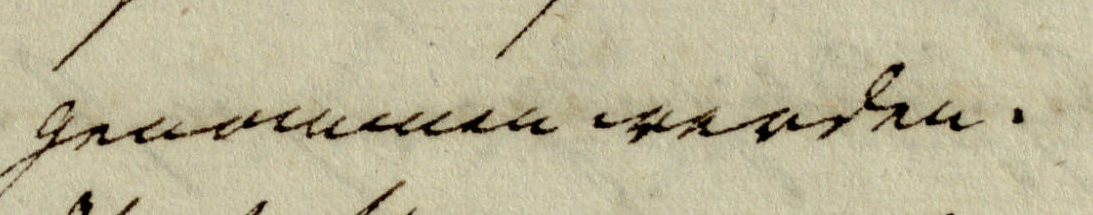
genommen werden.
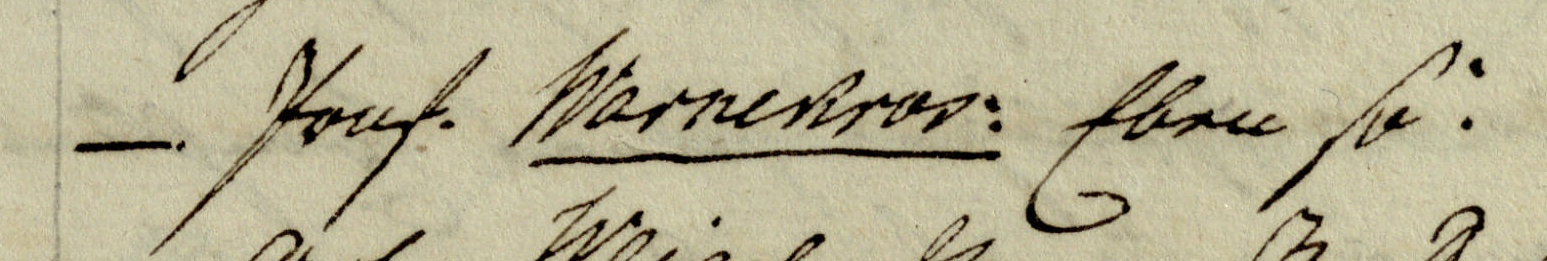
Prof. Warnekros. Eben so.
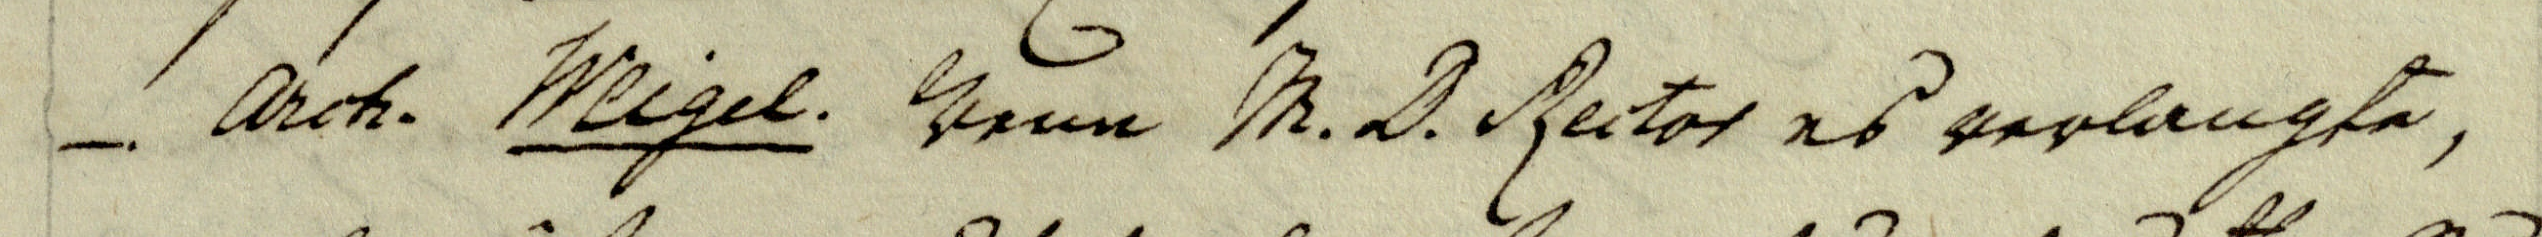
Arch. Weigel. Wenn M. D. Rector es verlangte,
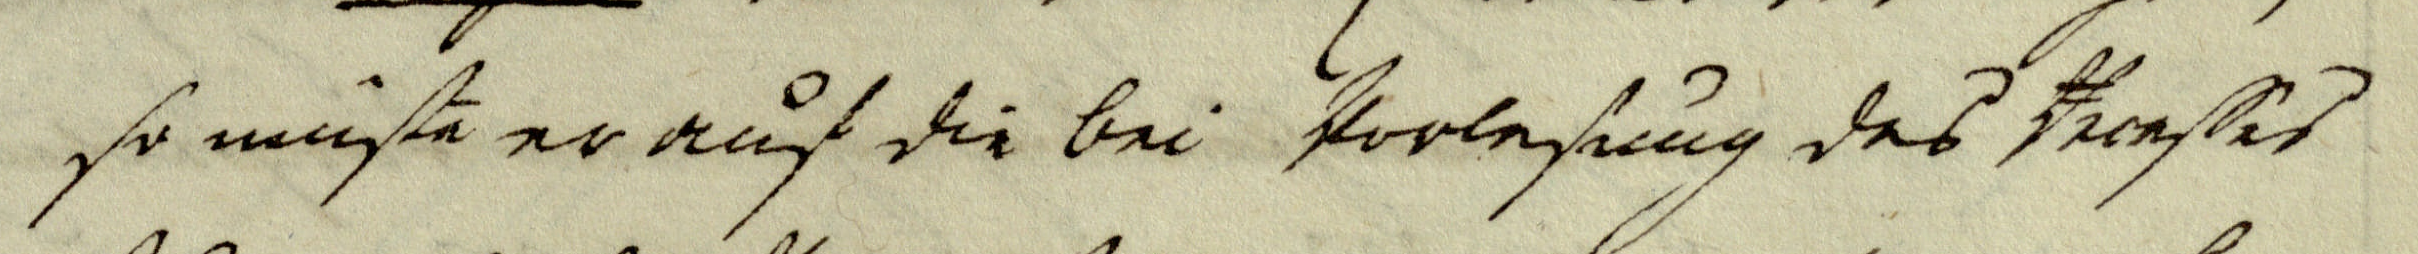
so müßte er auf die bei Vorlesung des Recesses
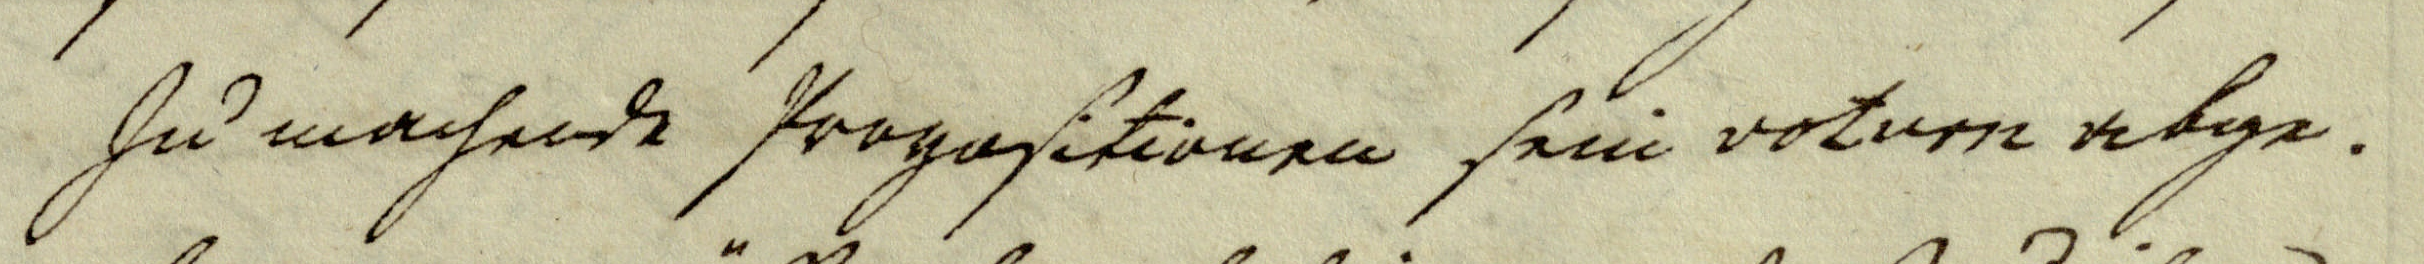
zu machende Propositionen sein votum abge¬
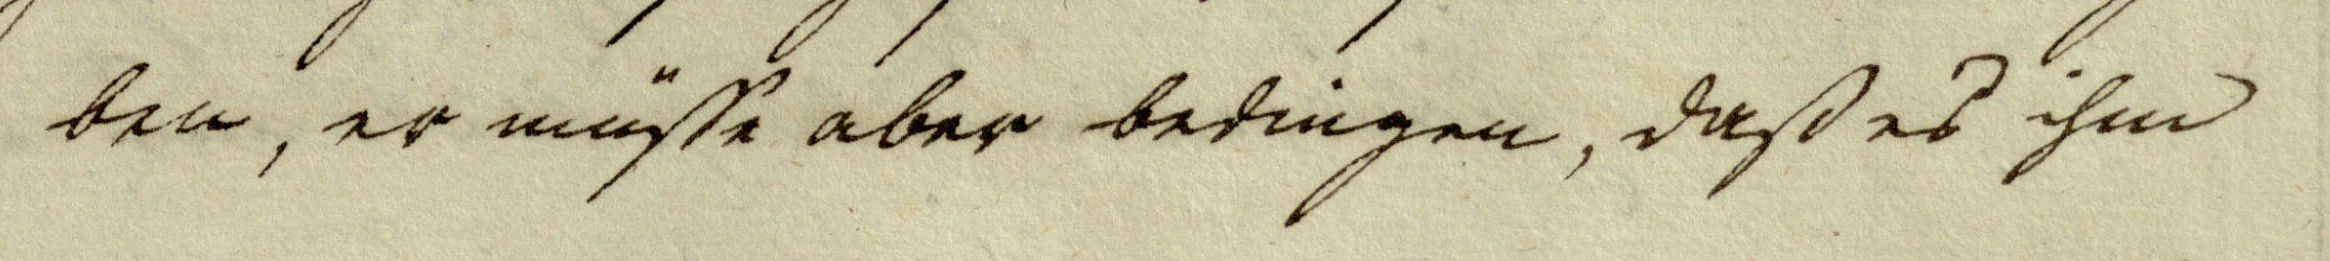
ben, er müsse aber bedingen, daß es ihm
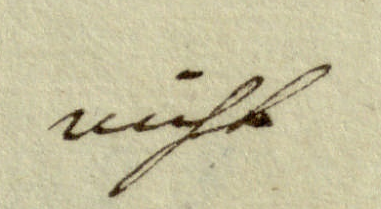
nicht
